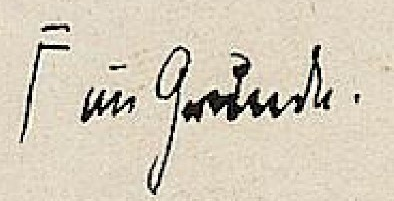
[ im Grunde.
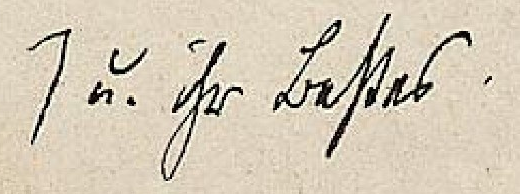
] u. ihr Bestes.
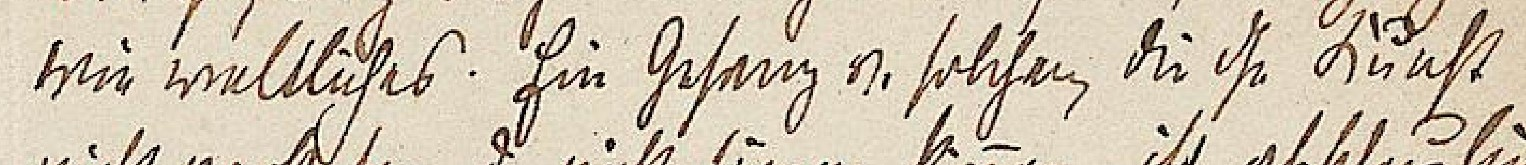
wie weltliches. Ein Gesang v. solchen, die dse Kunst
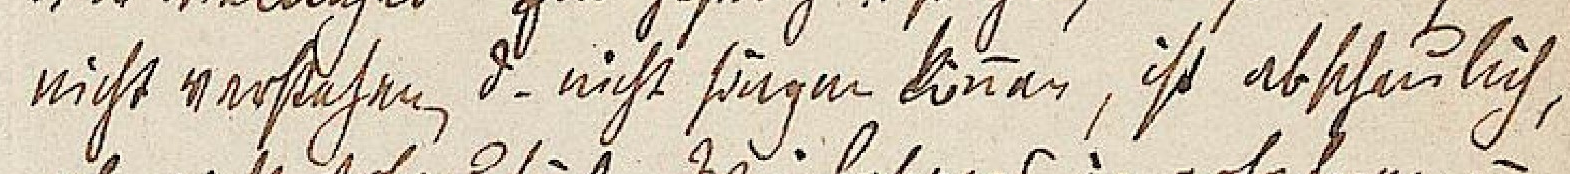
nicht verstehen, d. nicht singen könen, ist abscheulich,
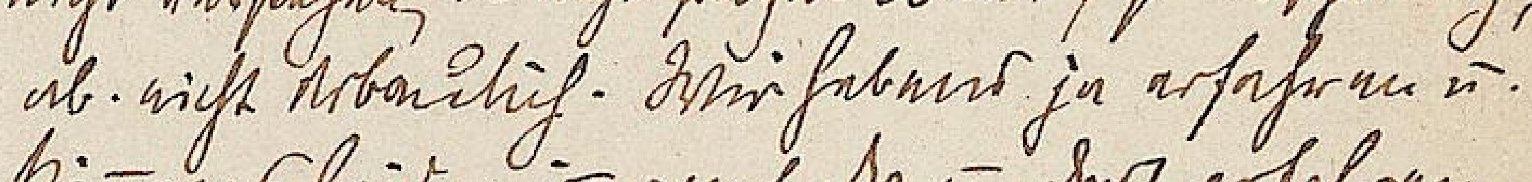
ab. nicht erbaulich. Wir habens ja erfahren u.
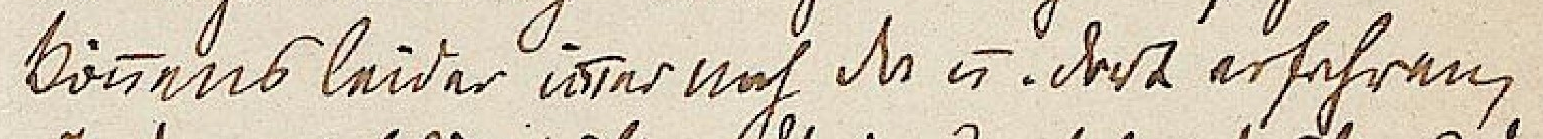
könens leider imer noch noch da u. dort erfahren,
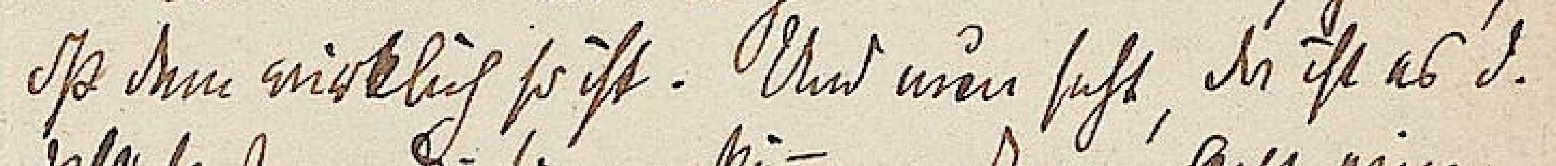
daß dem wirklich so ist. Und nun seht, da ist es d.
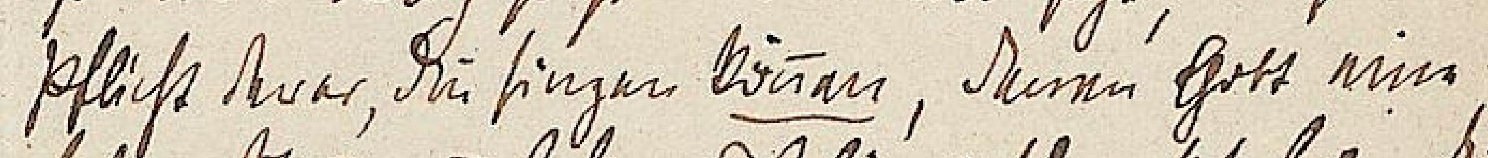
Pflicht derer, die singen könen, denen Gott, eine
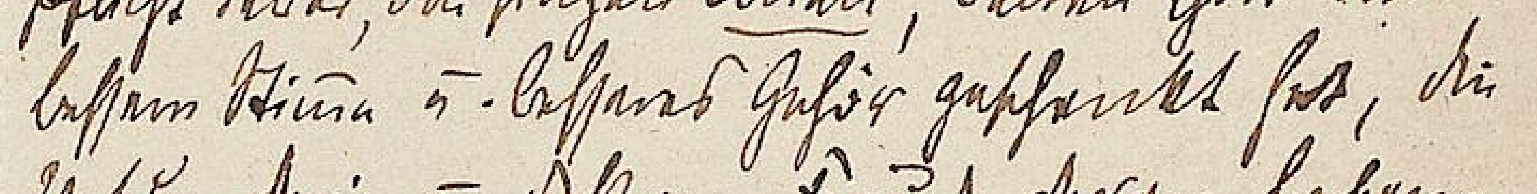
bessere Stime u. besseres Gehör geschenkt hat, die
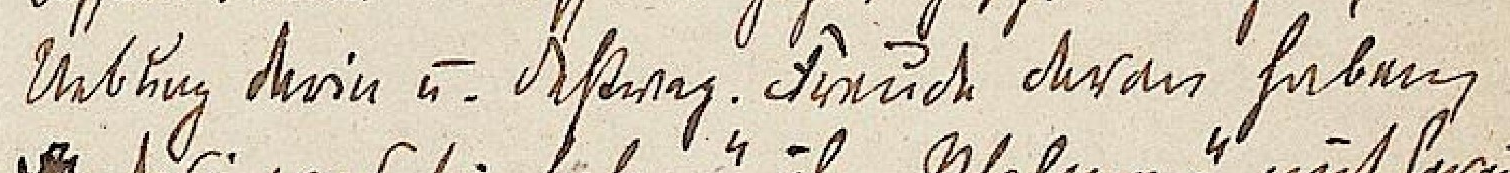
Uebung darin u. desweg. Freunde daran haben,
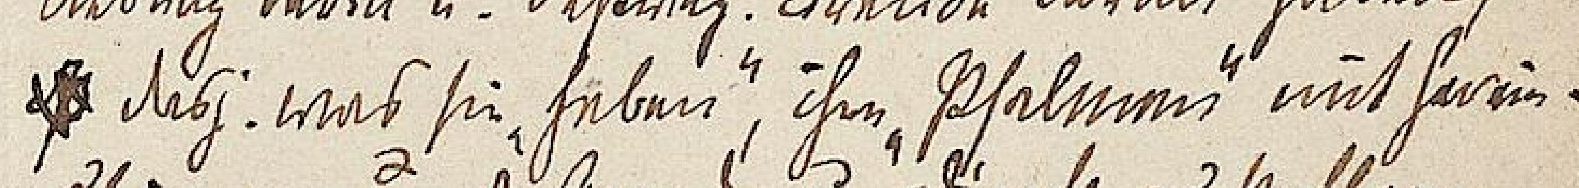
ist dasj. was sie "haben", ihre "psalmen" mit herein¬
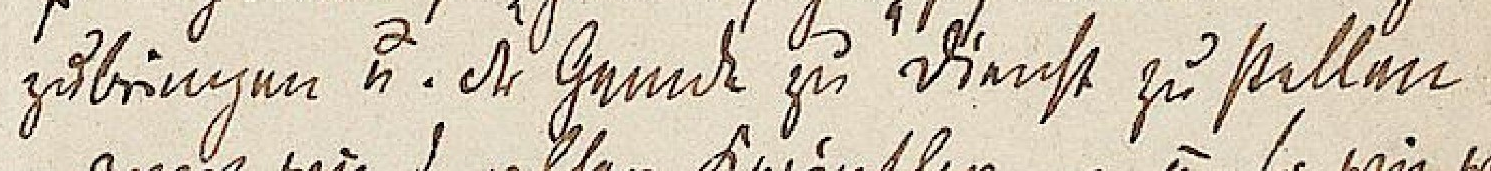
zubringen u. der Gemde zu Dienst zu stellen
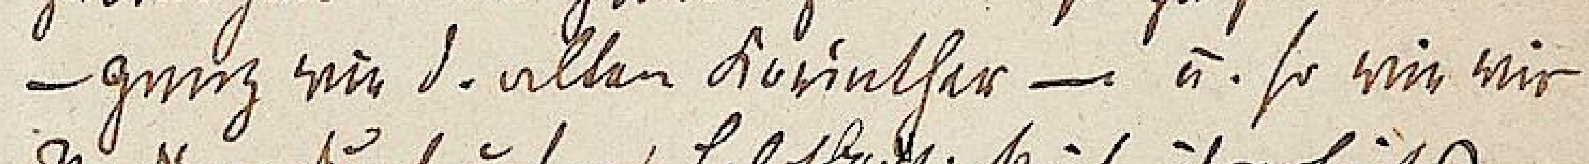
_ ganz wie d. alten Korinther _ u. so wie wir
